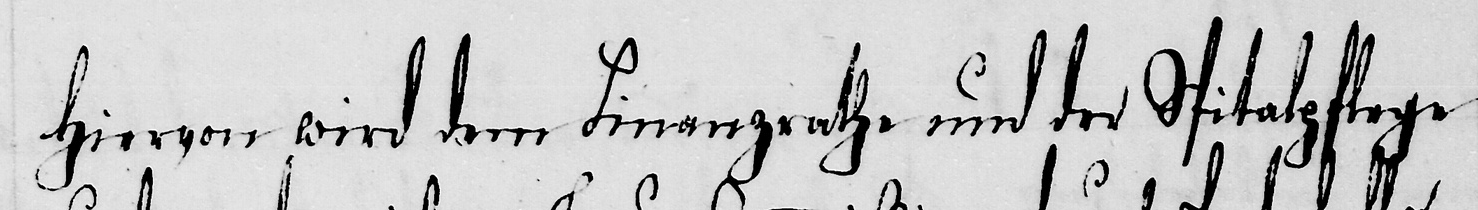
Hiervon wird dem Finanzrathe und der Spitalpflege
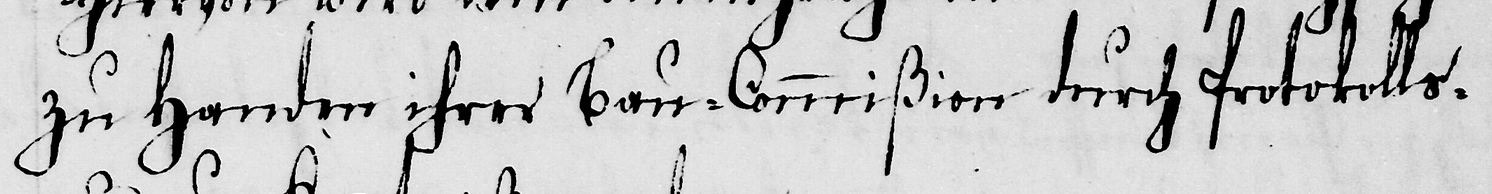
zu Handen ihrer Bau-Commißion durch Protokolls¬
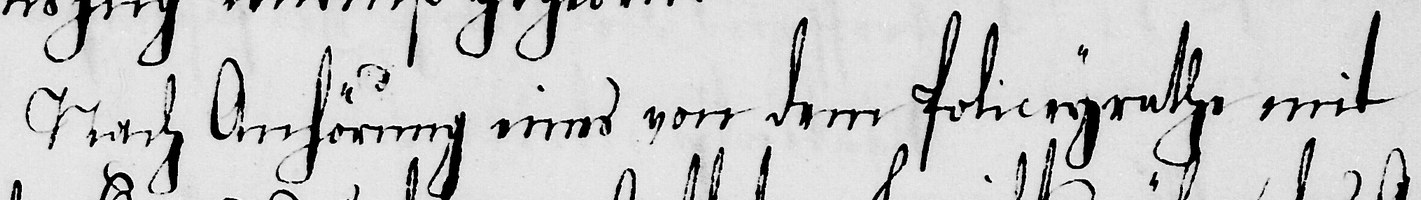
Nach Anhörung eines von dem Policeyrathe mit
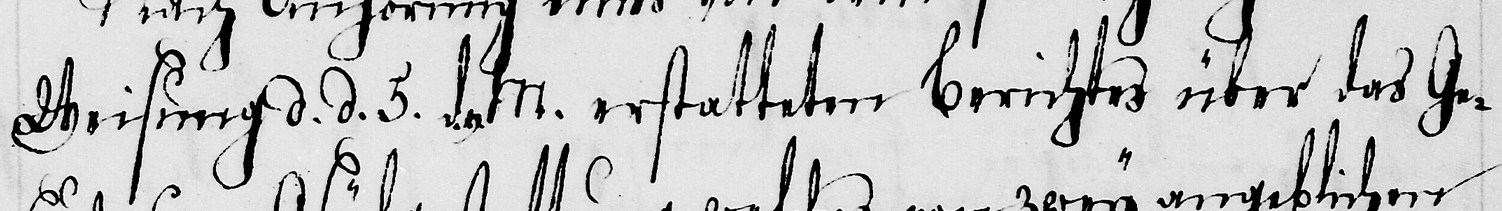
Weisung d. d. 5. d. v. M. erstatteten Berichtes über das Ge¬
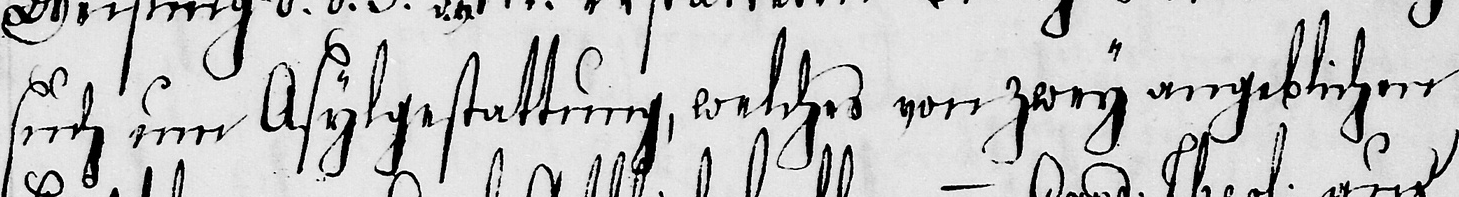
such um Asylgestattung, welches von zwey angeblichen
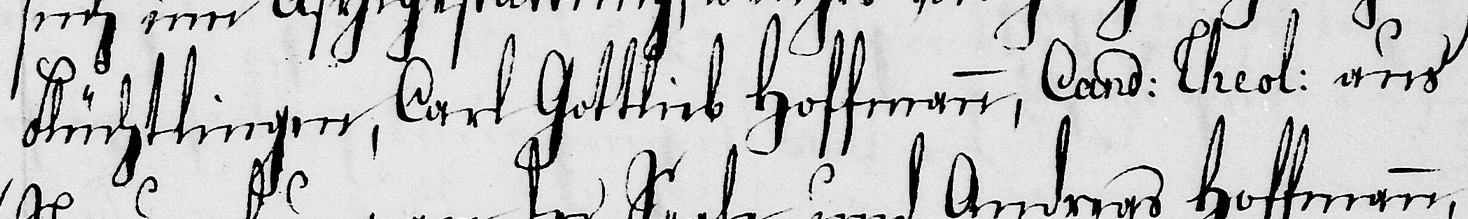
Flüchtlingen, Carl Gottlieb Hoffmann, cand: theol: aus
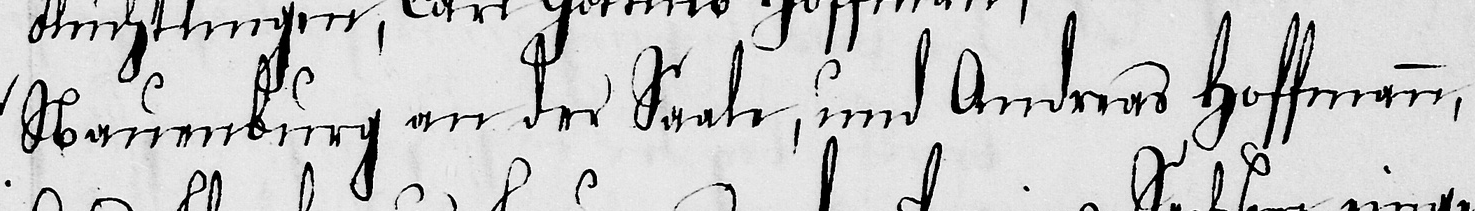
Nauenburg an der Saale, und Andreas Hoffmann,
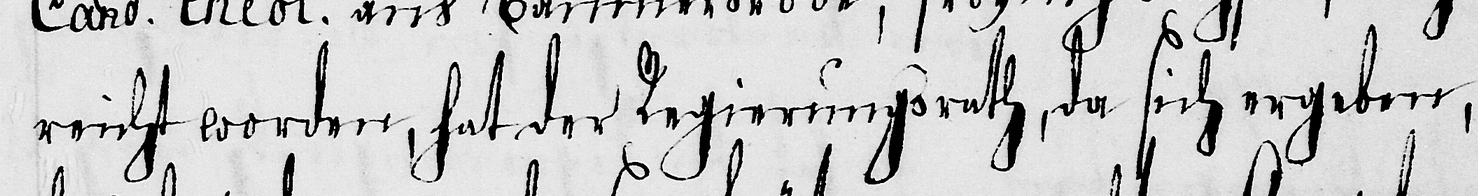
reicht worden, hat der Regierungsrath, da sich ergeben,
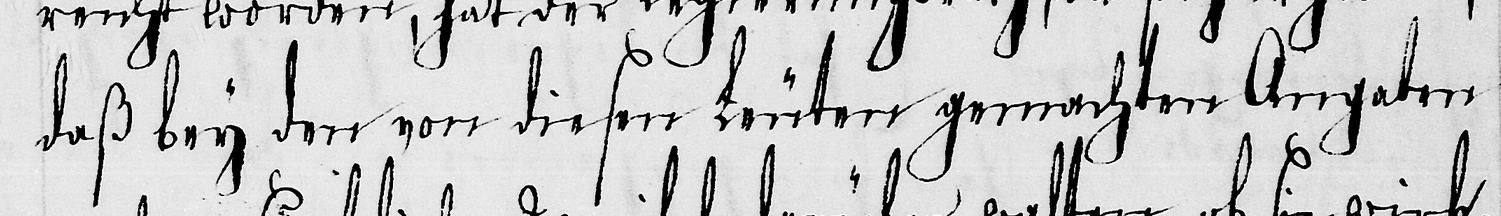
daß bey den von diesen Leuten gemachten Angaben
